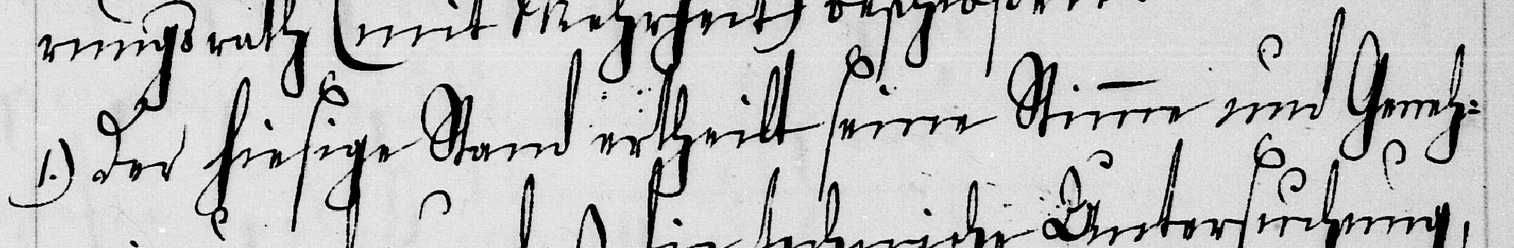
1.) Der hiesige Stand ertheilt seine Stimme und Geneh¬
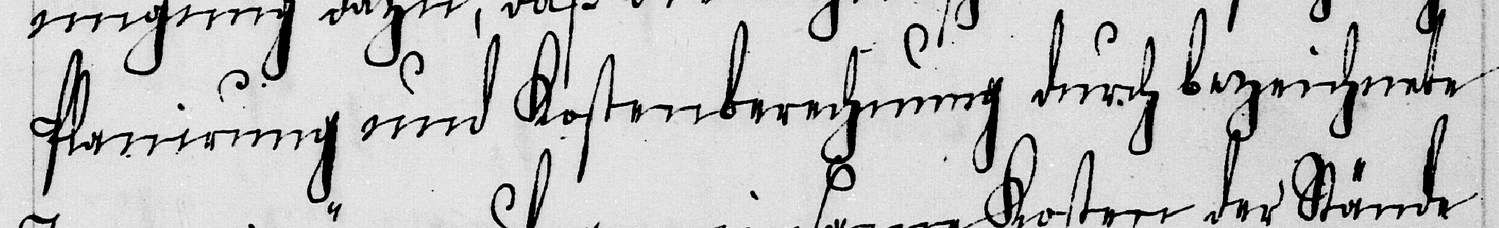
Planirung und Kostenberechnung durch bezeichnete
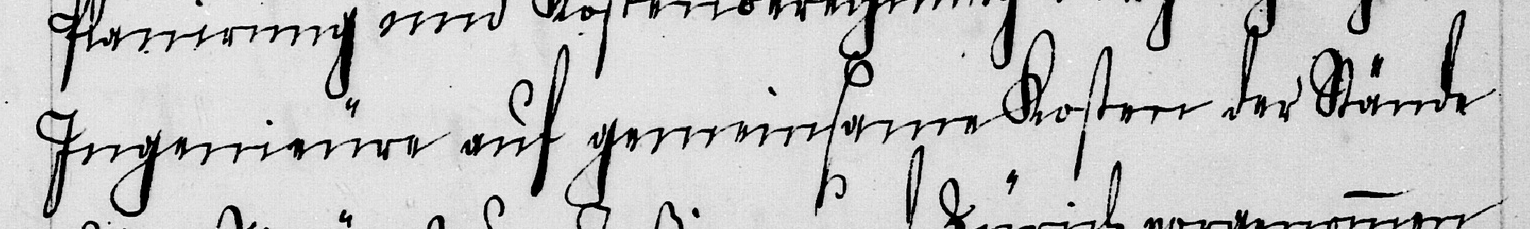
Ingenieure auf gemeinsame Kosten der Stände
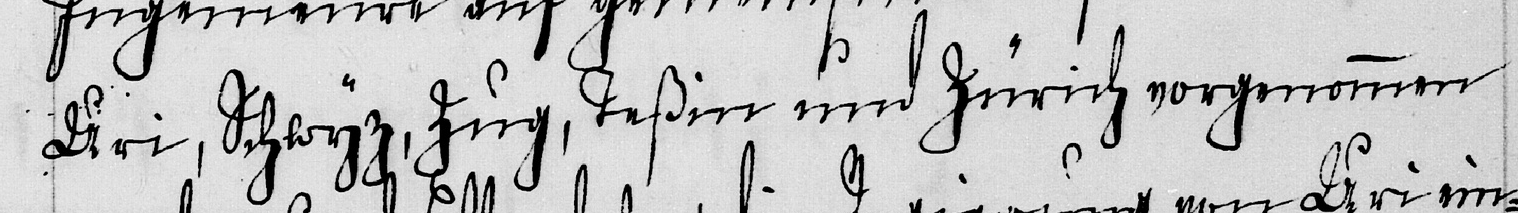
Uri, Schwyz, Zug, Teßin und Zürich vorgenommen
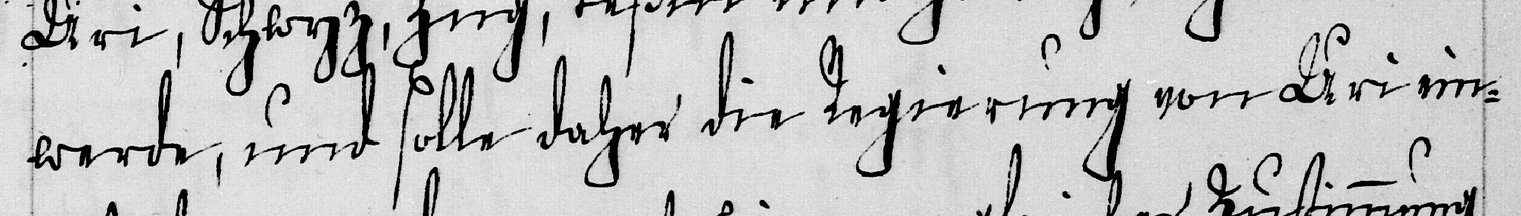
werde, und solle daher die Regierung von Uri ein¬
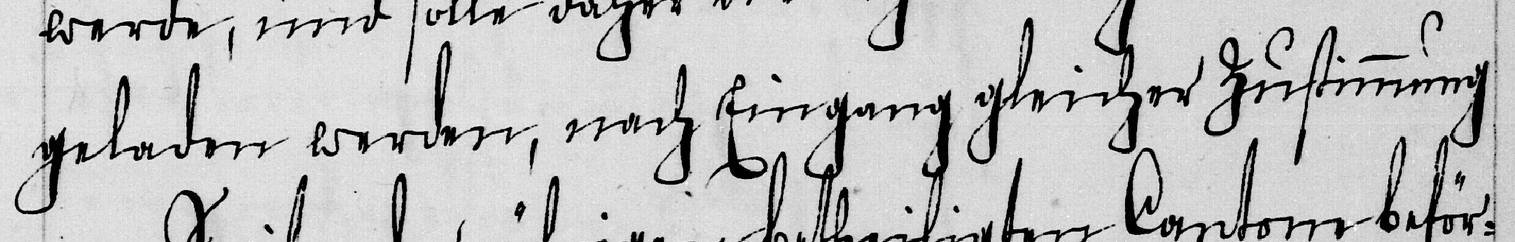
geladen werden, nach Eingang gleicher Zustimmung
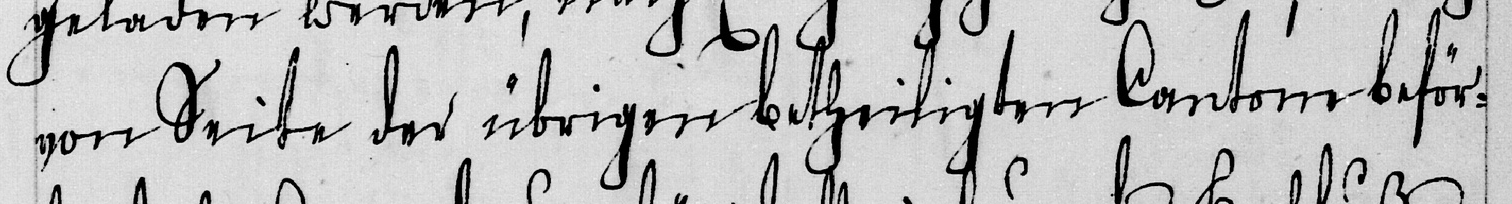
von Seite der übrigen betheiligten Cantone beför¬
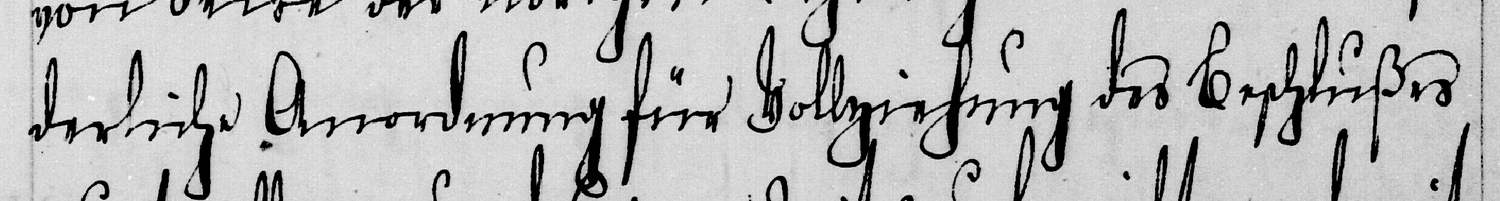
derliche Anordnung für Vollziehung des Beschlußes
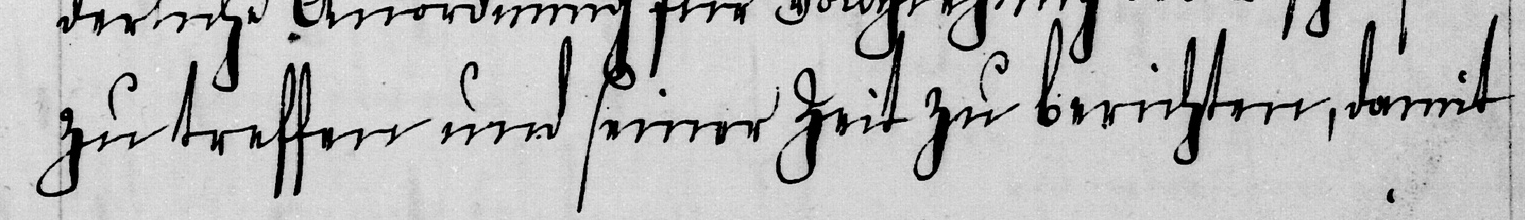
zu treffen und seiner Zeit zu berichten, damit
